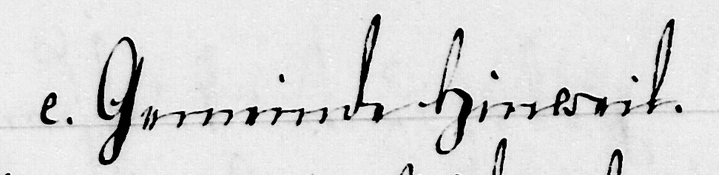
e. Gemeinde Hinweil.
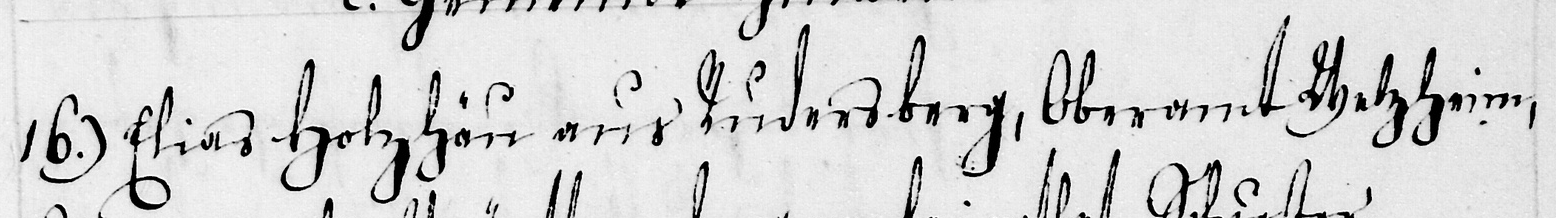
16.) Elias Holzhäu aus Rudersberg, Oberamt Welzheim,
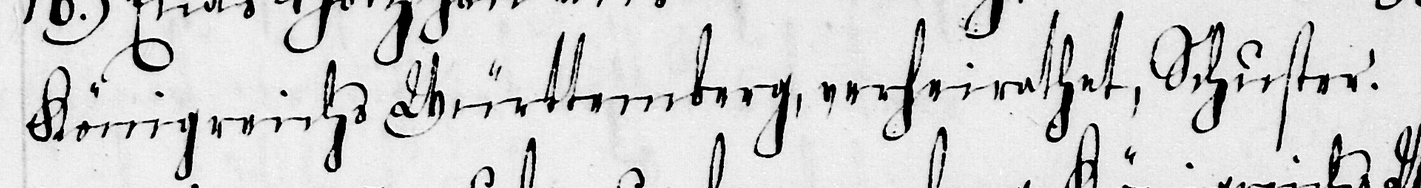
Königreichs Württemberg, verheirathet, Schuster.
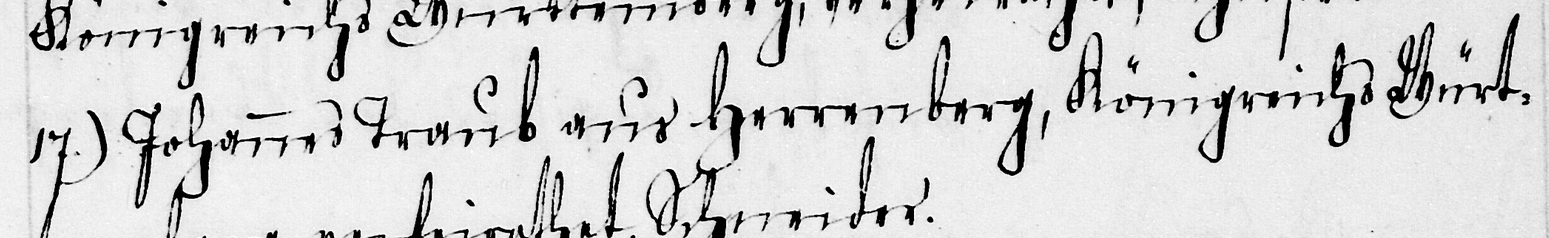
17.) Johannes Traub aus Herrenberg, Königreichs Würt¬
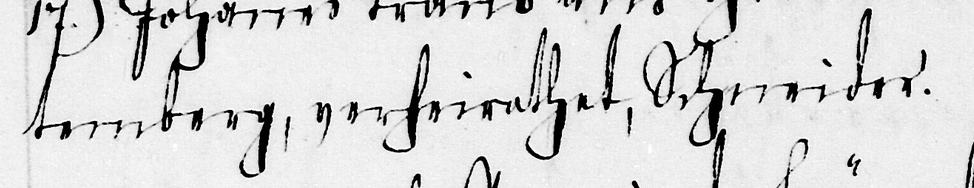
temberg, verheirathet, Schneider.
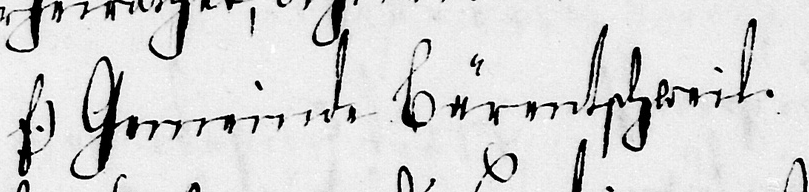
f.) Gemeinde Bärentschweil.
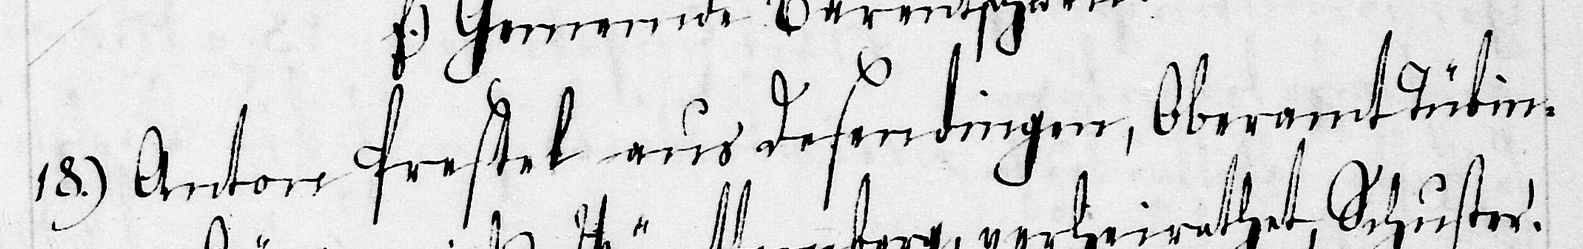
18.) Anton Prestel aus Desendingen, Oberamt Tübin¬
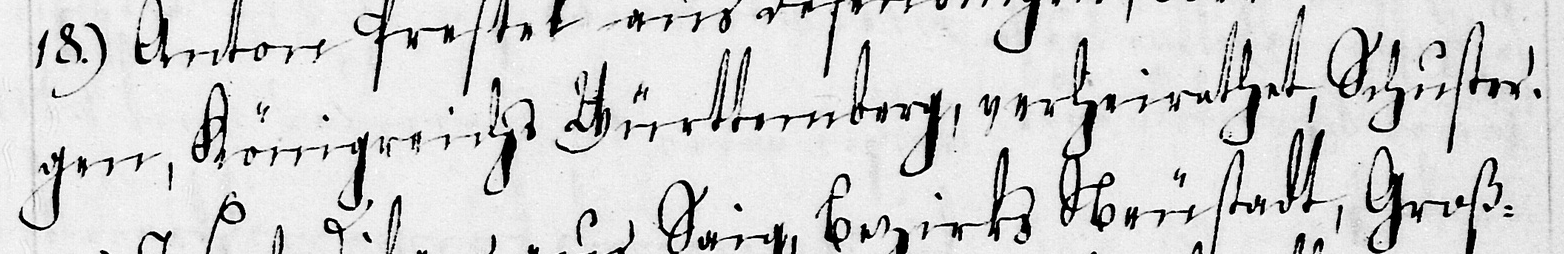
gen, Königreichs Württemberg, verheirathet, Schuster.
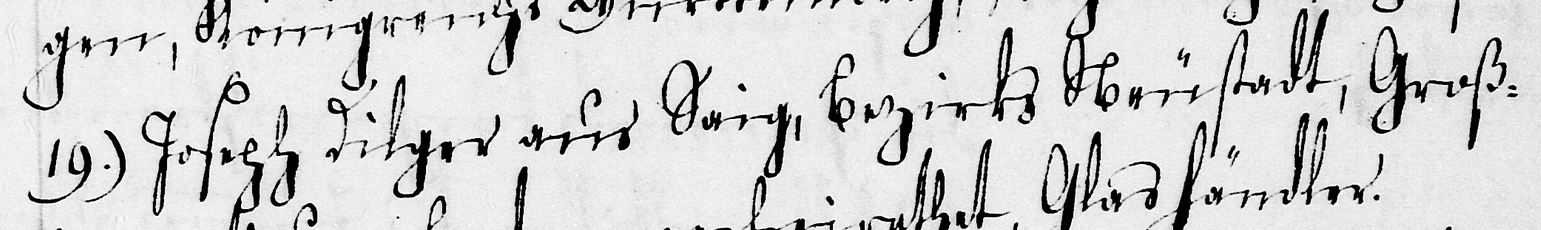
19.) Joseph Dilger aus Saig, Bezirks Neustadt, Groß¬
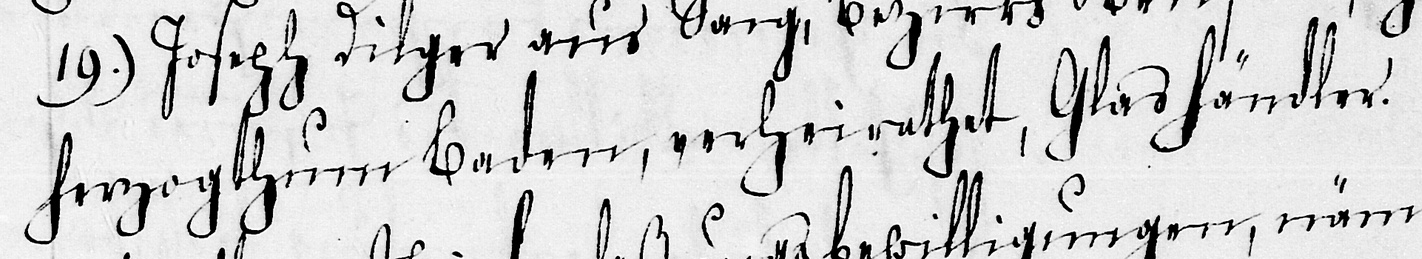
herzogthum Baden, verheirathet, Glashändler.
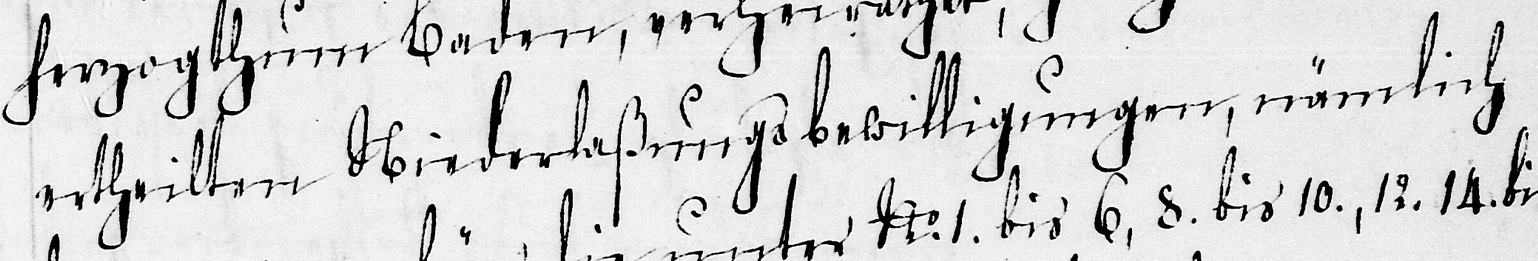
ertheilten Niederlaßungsbewilligungen, nämlich
